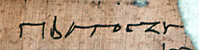γιβαλοϲζη
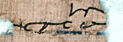̣σασω
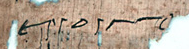εριδιατ
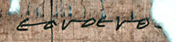εφηδεηθε
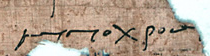αυτοχροωι
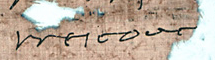ημειϲδωϲ
